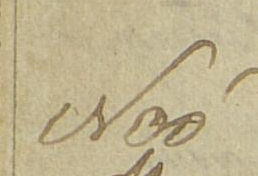Nov^r
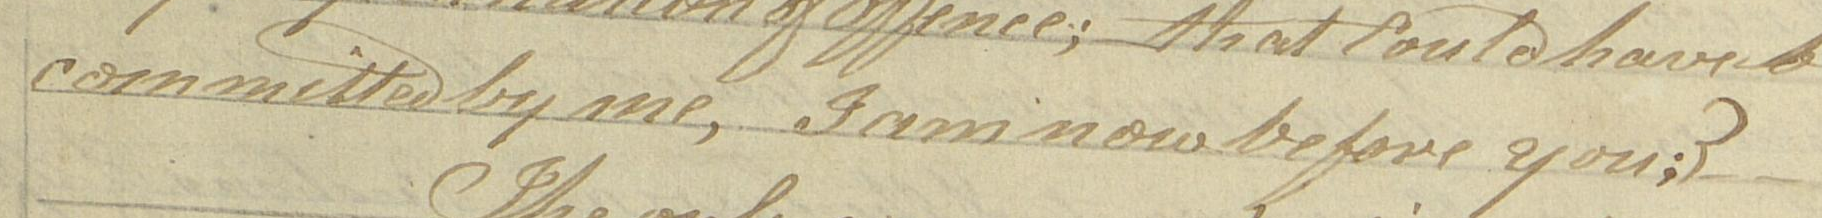committed by me, I am now before you;
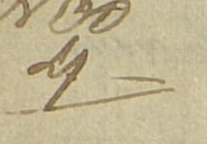4
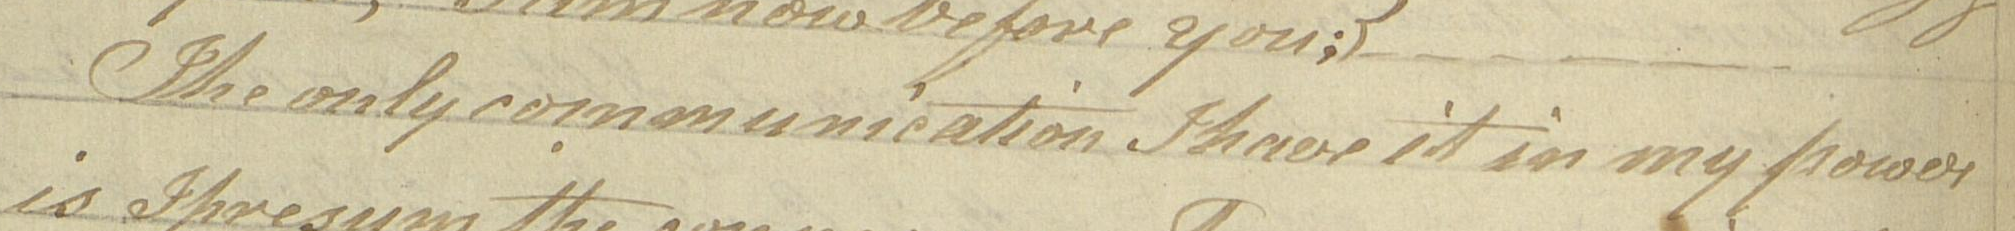The only communication I have it in my power
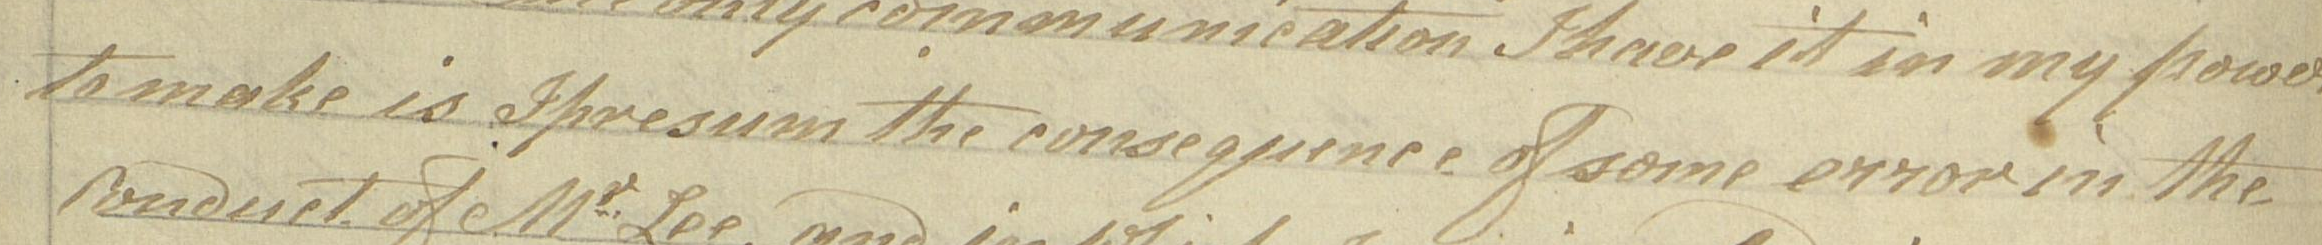to make is I presum the consequence of some error in the
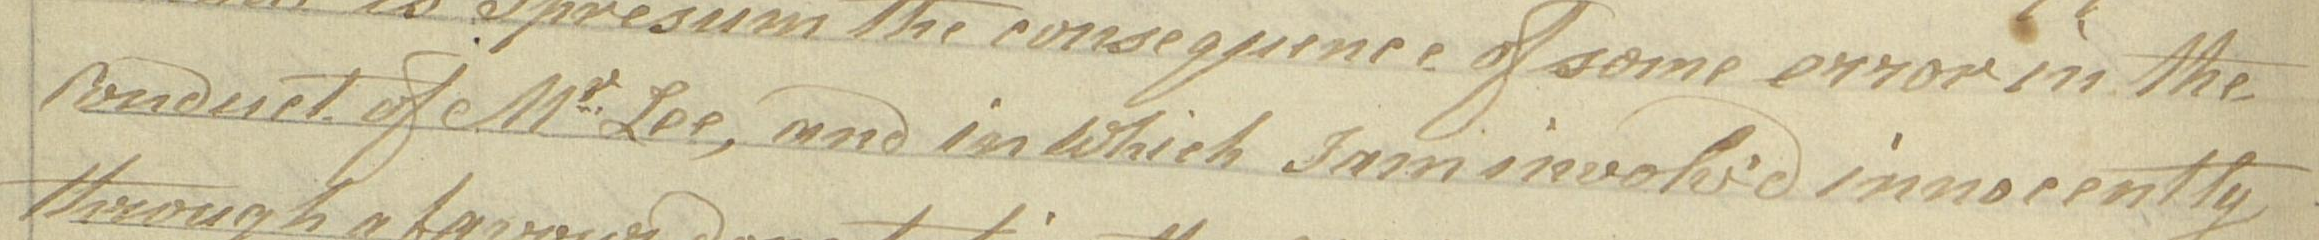Conduct of M^r. Lee, and in which I am involv'd innocently
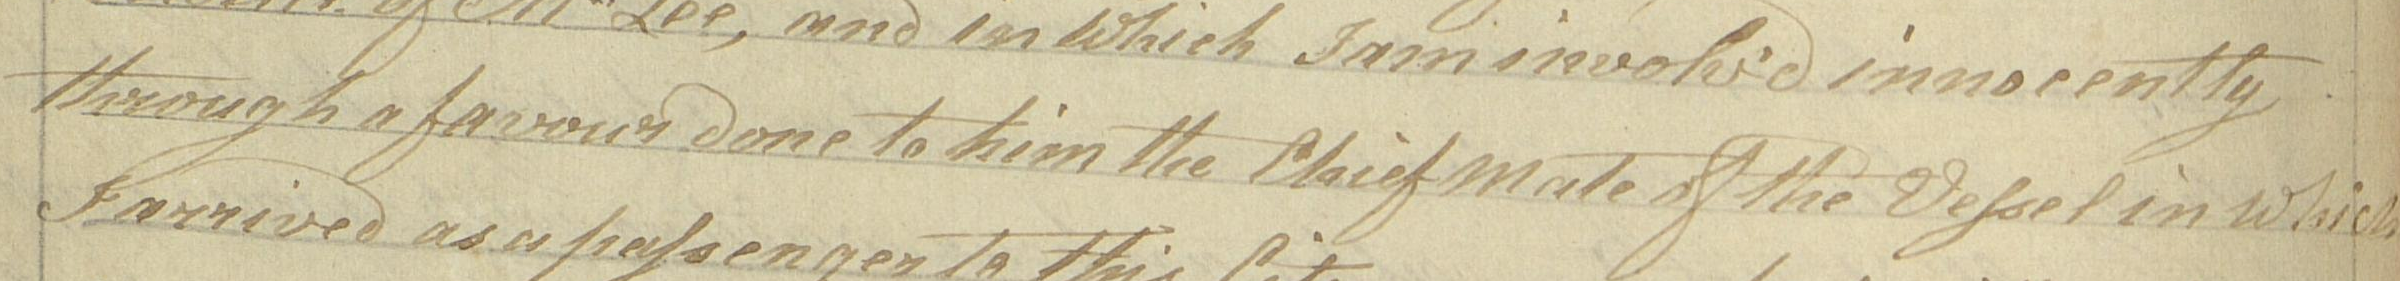through a favour done to him the Chief mate of the Vessel in which
